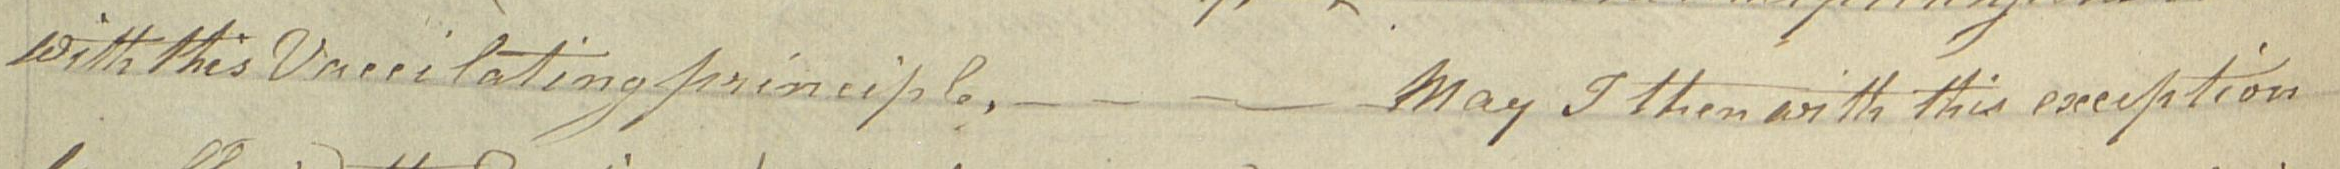With this Vaccilating principle, May I then with this exception
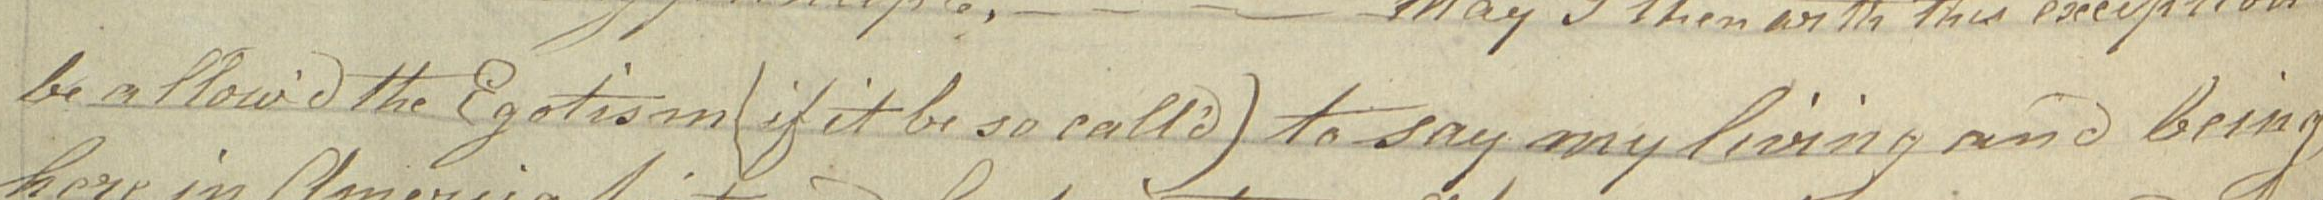be allow'd the Egotism (if it be so call'd) to say my living and being
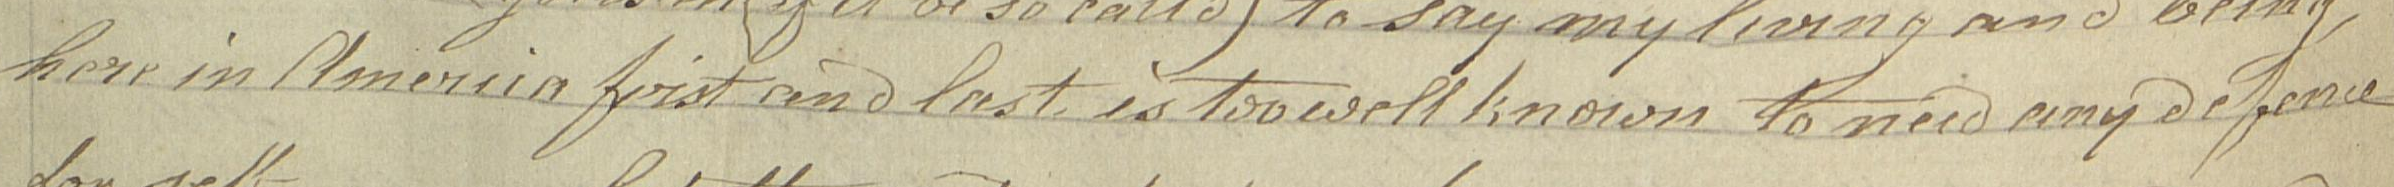here in America first and last is too well known to need any defence
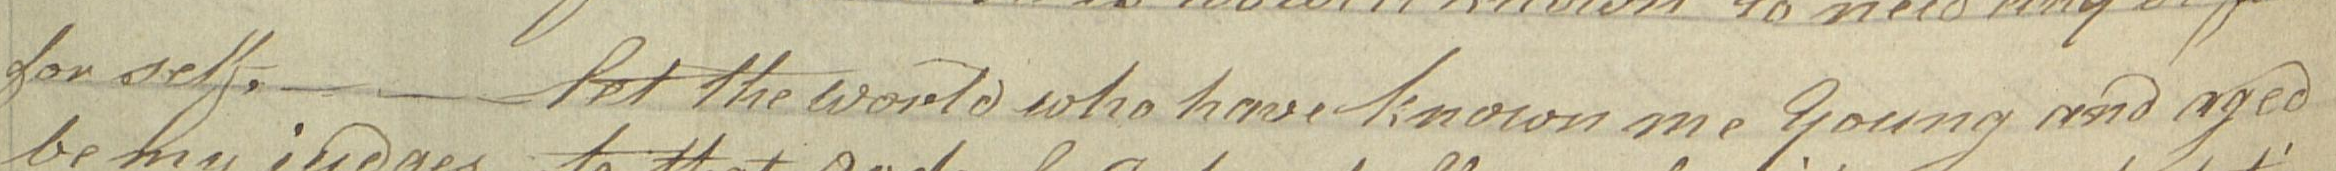for self. let the world who have known me Young and aged
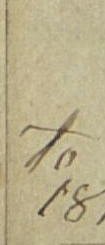to
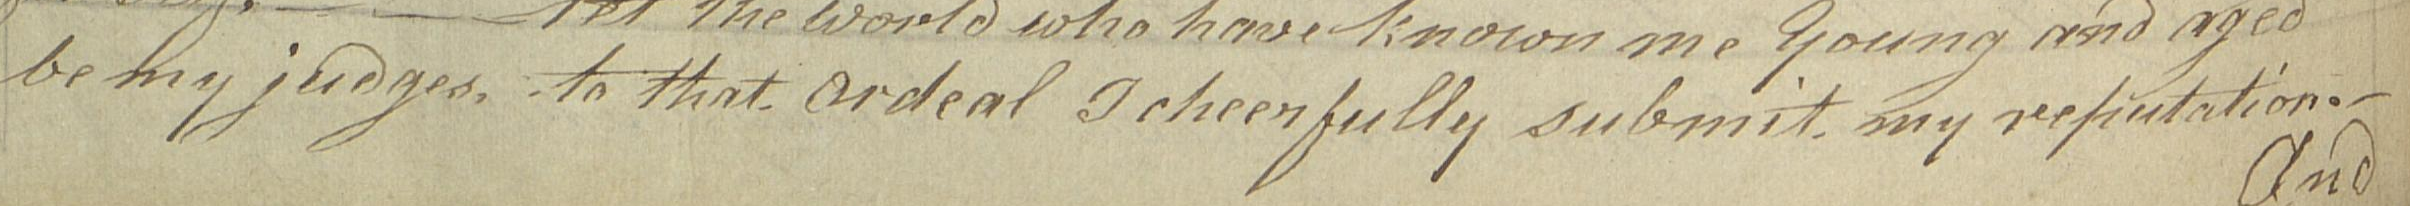be my judges, to that ordeal I cheerfully submit my reputation.
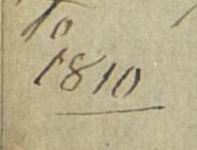1810
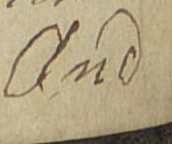And
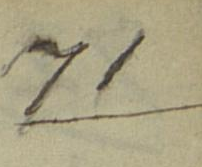71
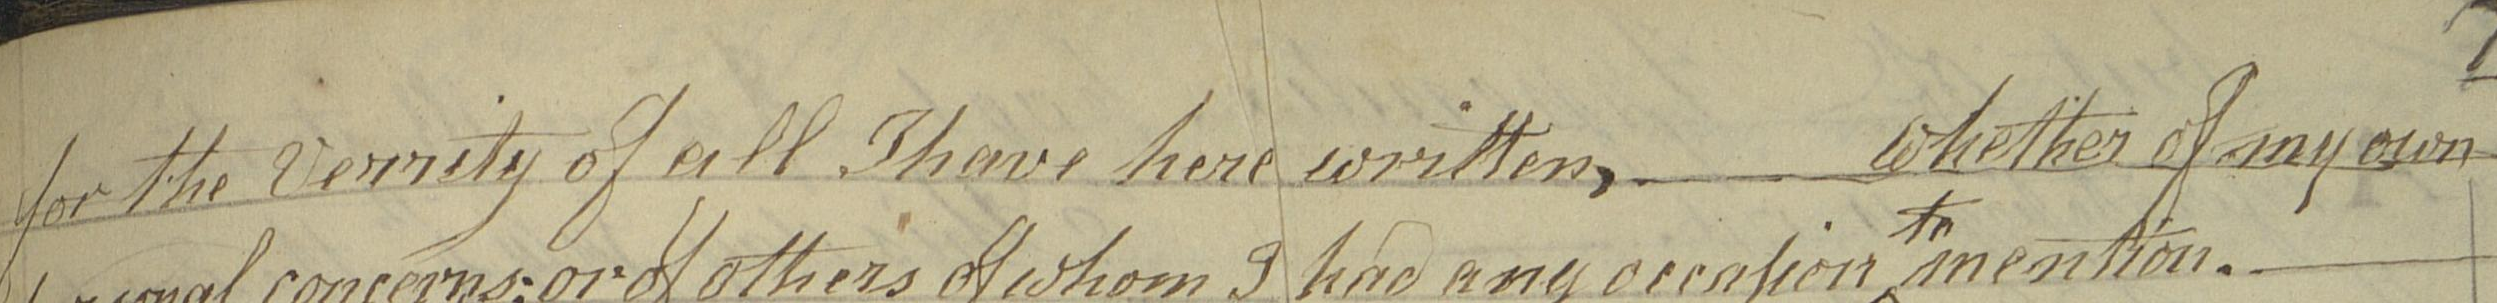for the Verrity of all I have here written, whether of my own
